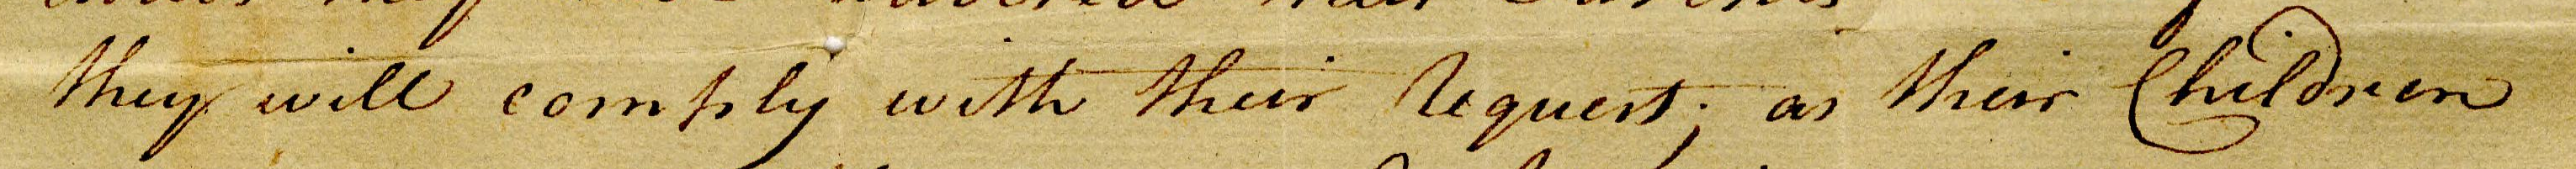they will comply with their requests; as their Children
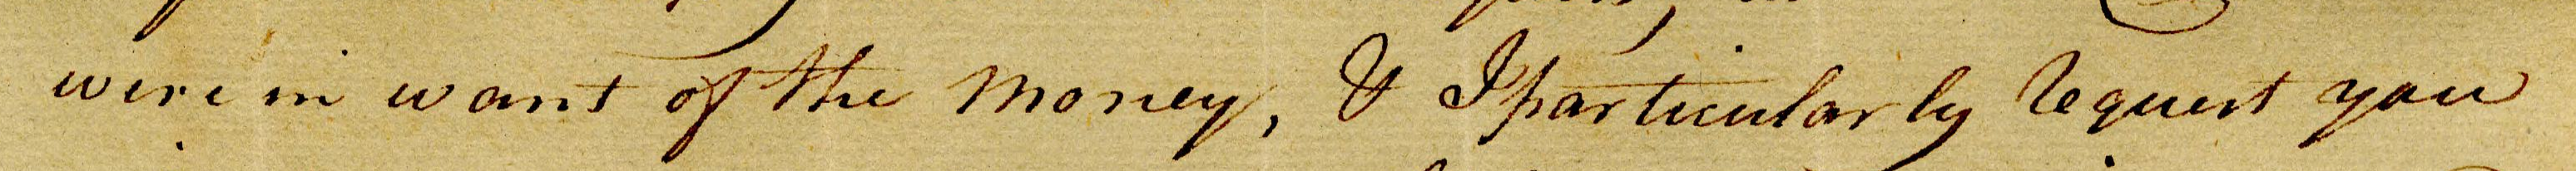were in want of the money, & I particularly request you
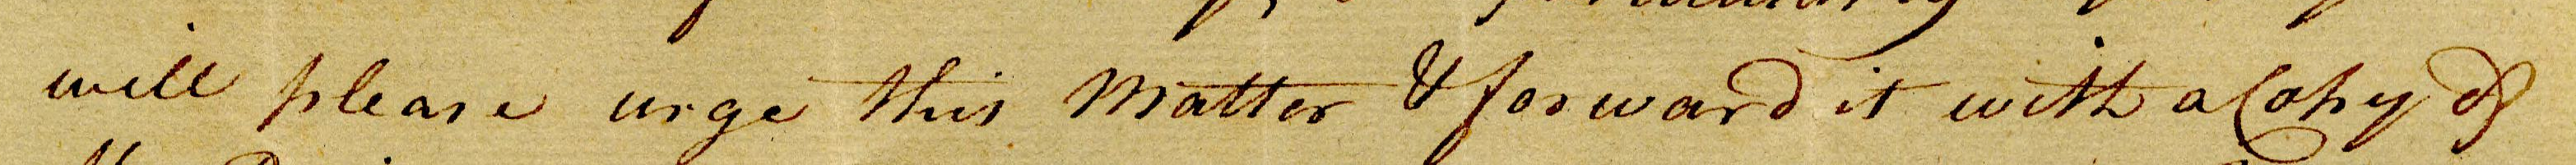will please urge this matter & forward it with a Copy of
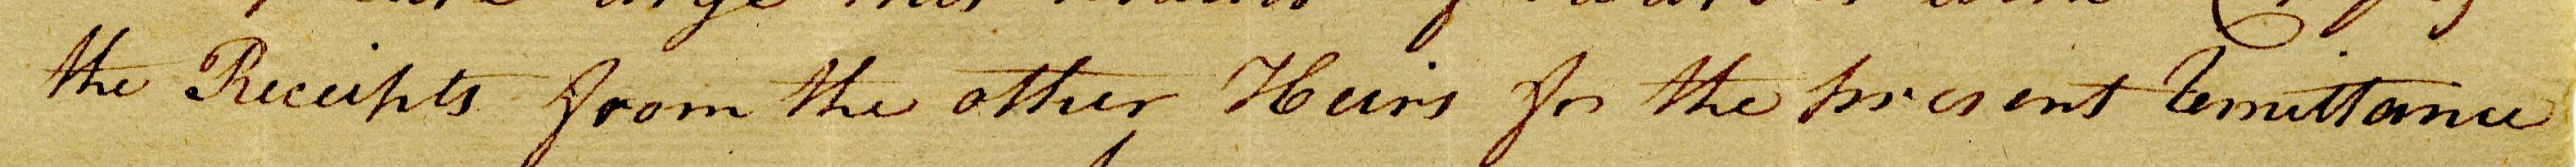the Receipts from the other Heirs for the present Remittance
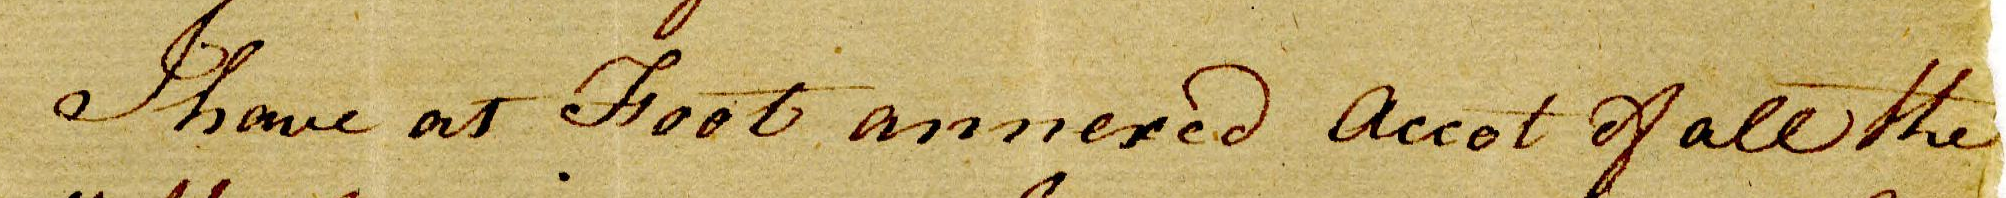I have at Foot annexed accot of all the
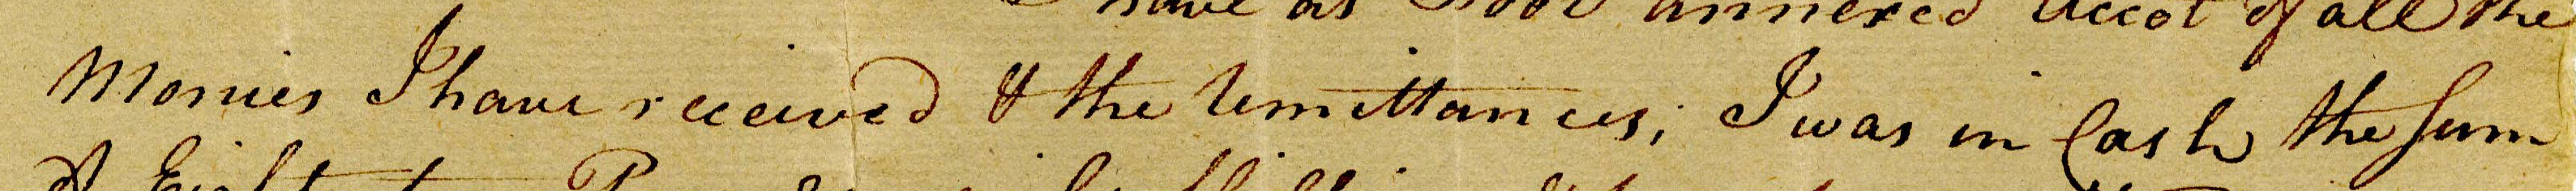Monies I have received & the remittances, I was in Cash the sum
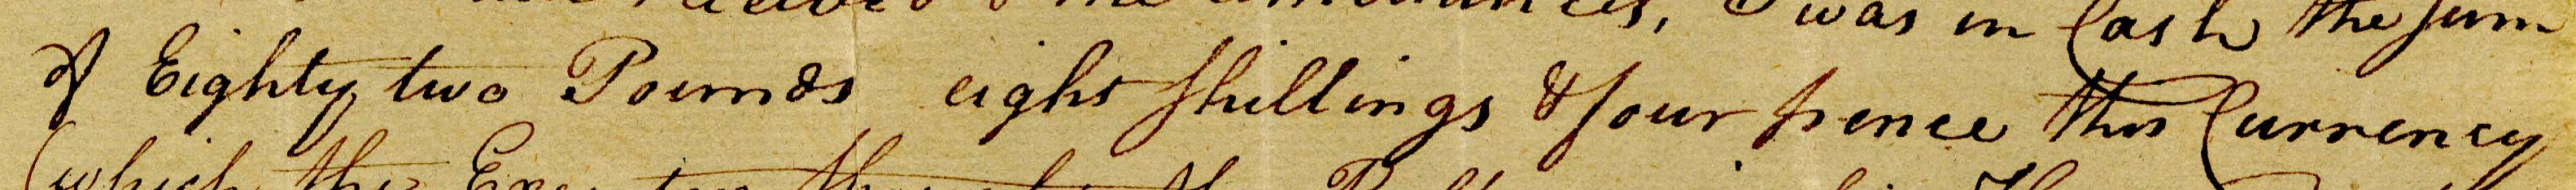of Eighty two Pounds eight shillings & four pence this currency
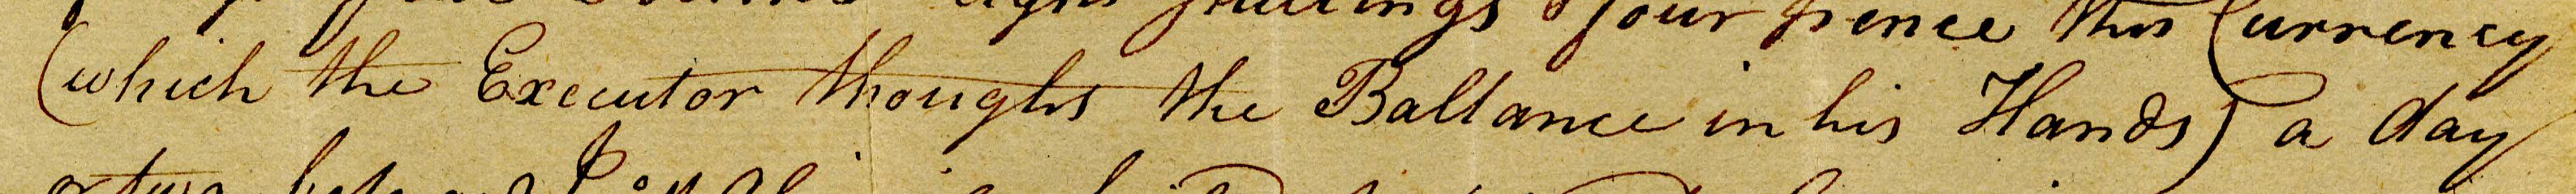(which the Executor thoughts the Balance in his Hands) a day
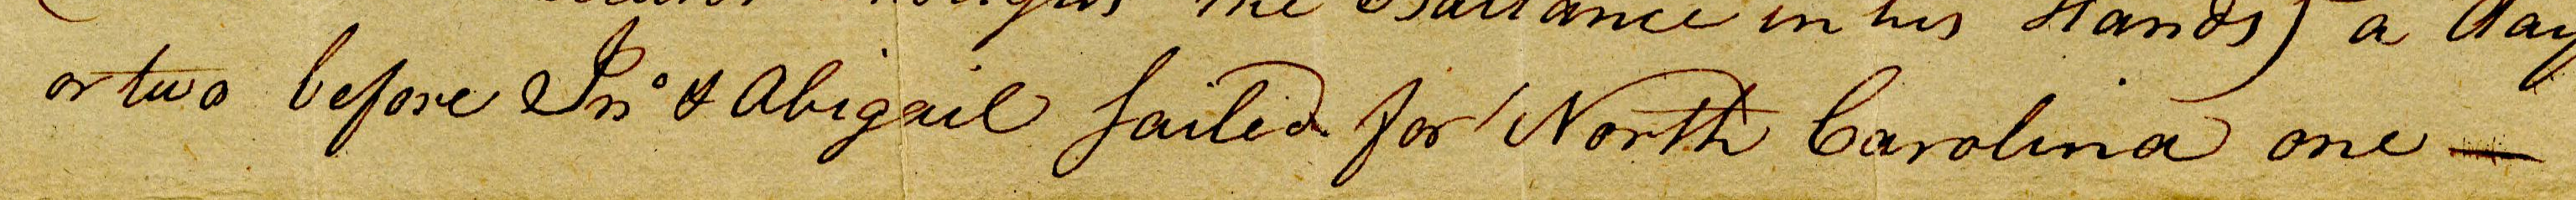or two before Jn^o & Abigail sailed for North Carolina one-
